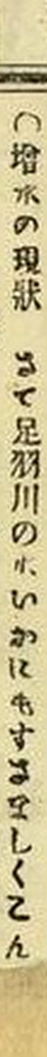○増水の現状さて足羽川の水いかにもすさましくこん
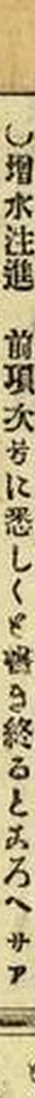○増水注進前項次号に悉しくと書き終るところへサア
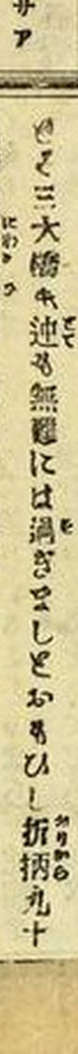とは三大橋も迚も無難には過ぎましとおもひし折柄九十
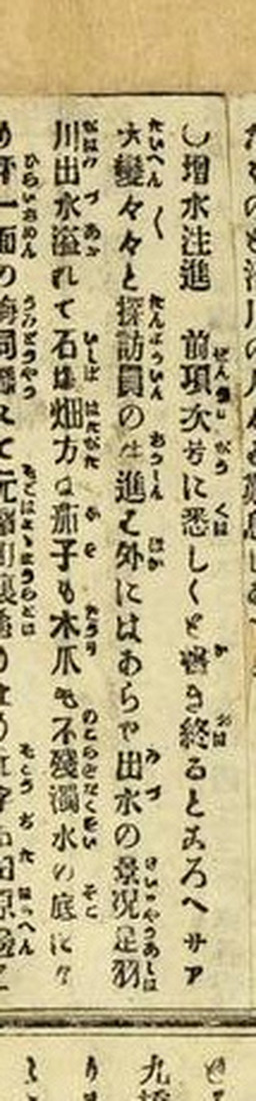大変々々と探訪員の注進は外にはあらで出水の景況足羽
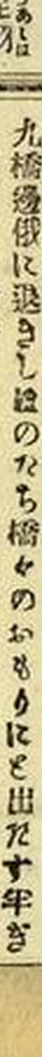九橋辺俄に退きしほのたち橋々のおもりにと出だす半ぎ
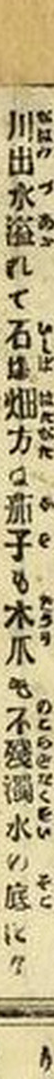川出水溢れて石場畑方は茄子も木瓜も不残濁水の底にな
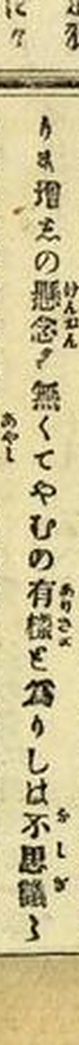りに増しの懸念は無くてやむの有様と為りしは不思議々
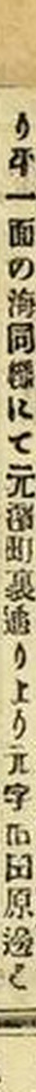り平一面の海同様にて元浜町裏通りより元宇治田原辺は
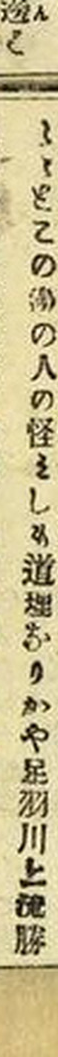々々とこの辺の人の怪みしも道理なりかや足羽川上流勝
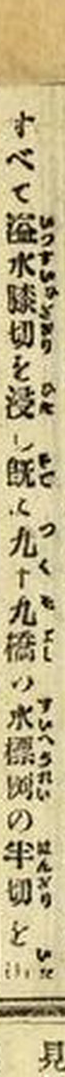すべて溢水膝切を浸し既に九十九橋の水標例の半切を出
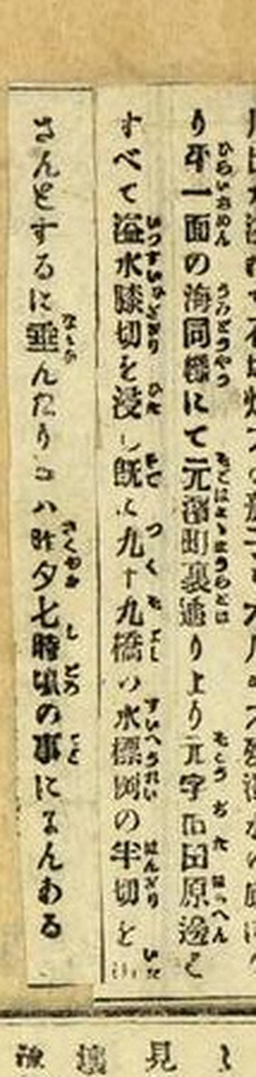すべて溢水膝切を浸し既に九十九橋の水標例の半切を出
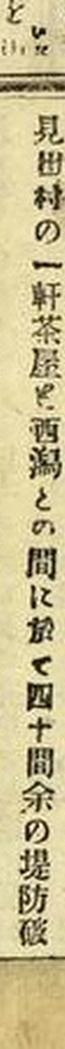見出村の一軒茶屋と西潟との間に於て四十間余の堤防破
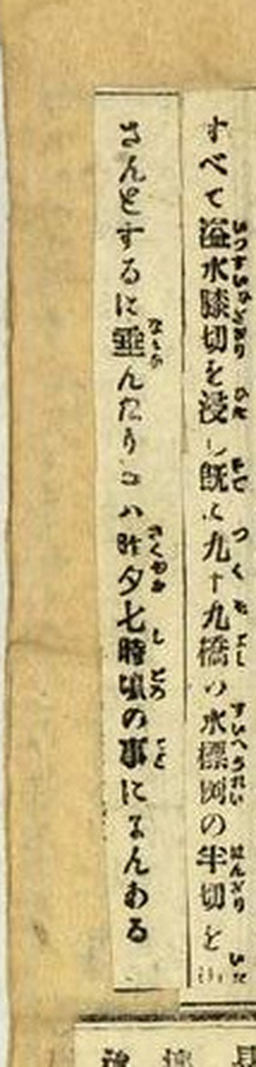さんとするに垂んたりこは昨夕七時頃の事になんある
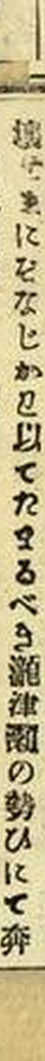壊せしにぞなじかわ以てたまるべき瀧津瀬の勢ひにて奔
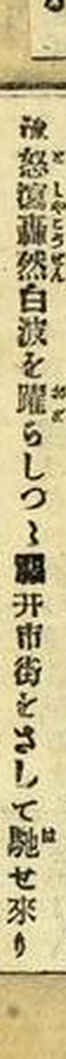流怒瀉轟然白波を躍らしつゝ福井市街をさして馳せ来り

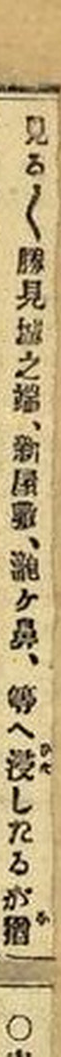見る〳〵勝見城之端、新屋敷、瀧ヶ鼻、等へ浸したるが猶
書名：温古集 五巻
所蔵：福井県文書館 Fukui Prefectural Archives
